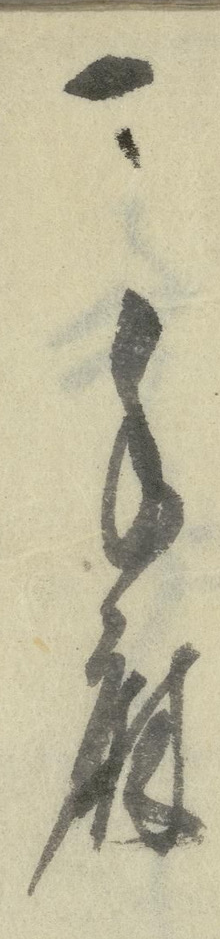一手酌
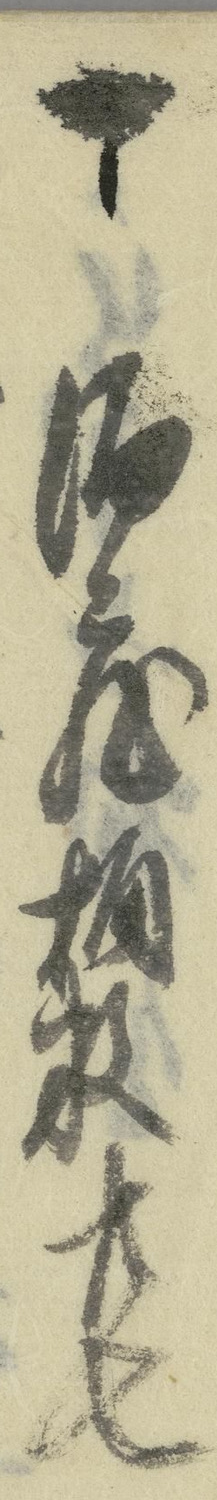一酒蔵桶数廿七
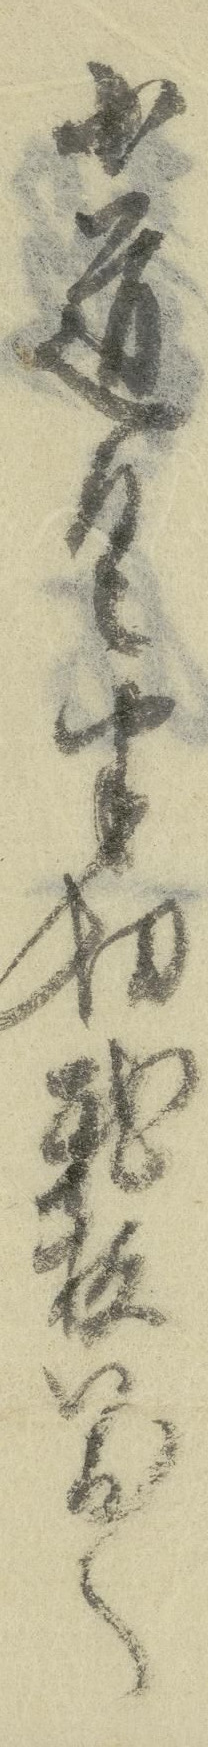小道具半切糀板いろ

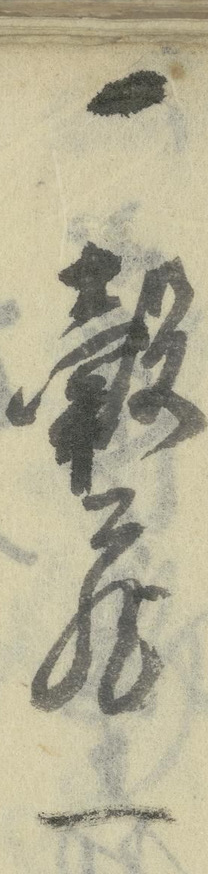一穀蔵一
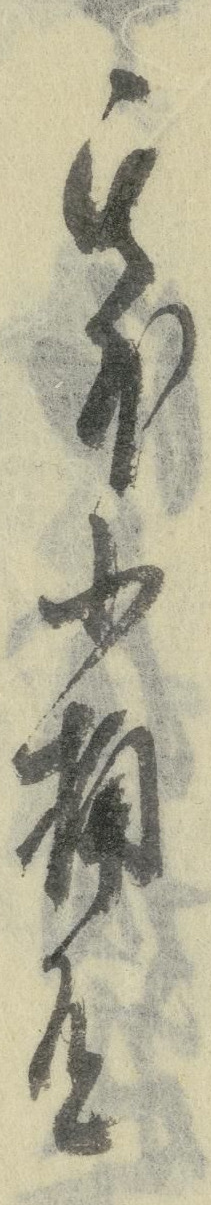其外小桶有
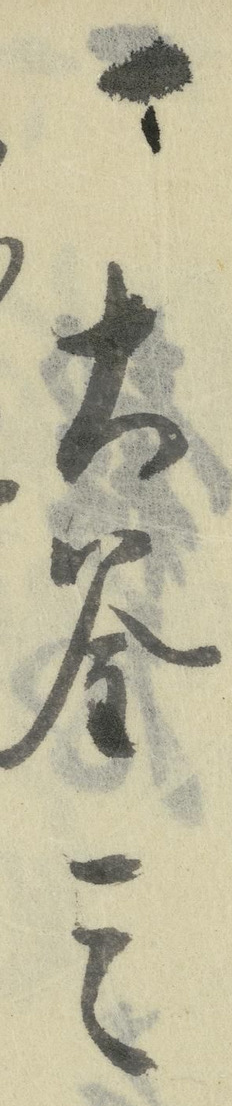一大釜三
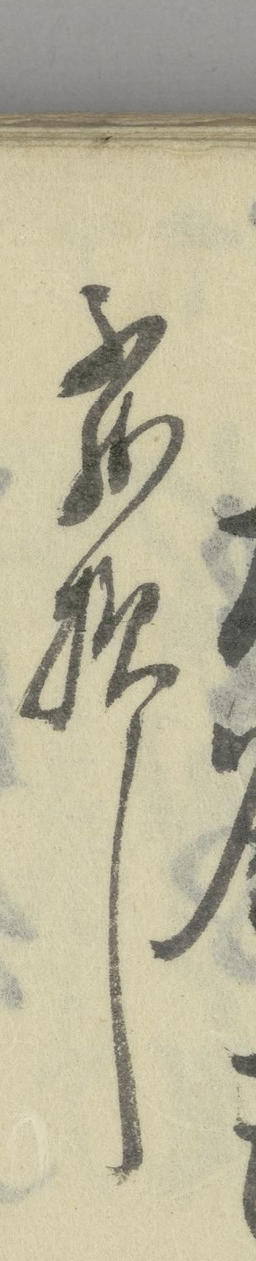不残損し
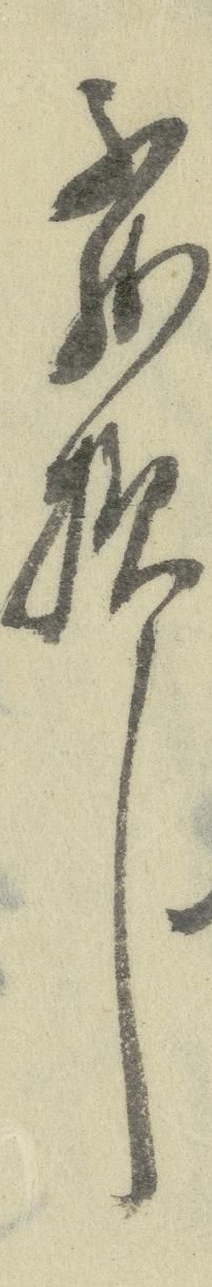不残損し
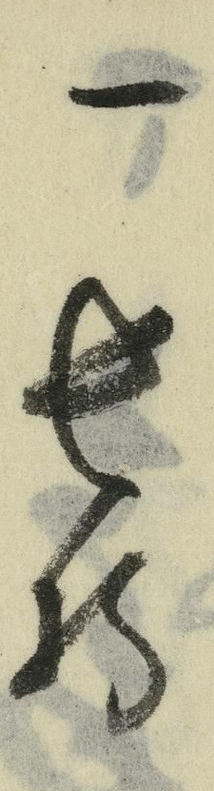一長持

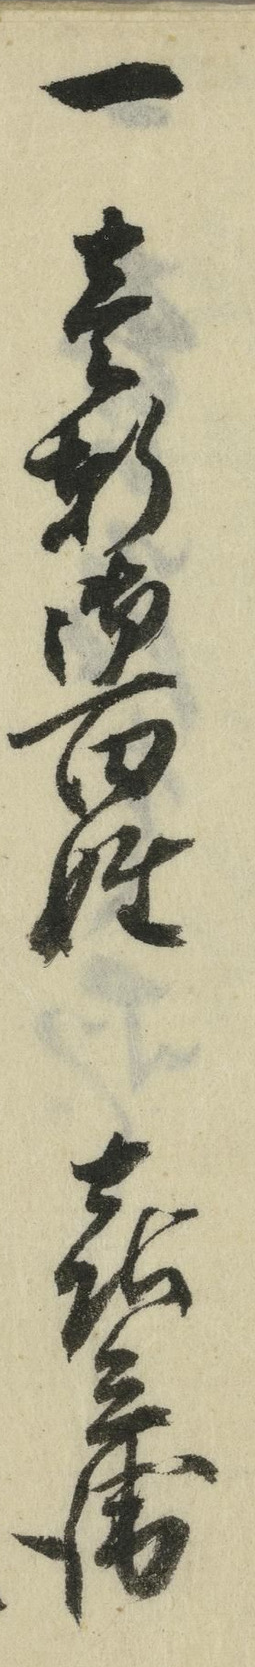一壱軒御百姓喜兵衛
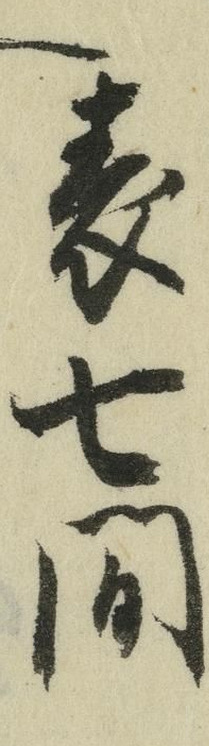表七間
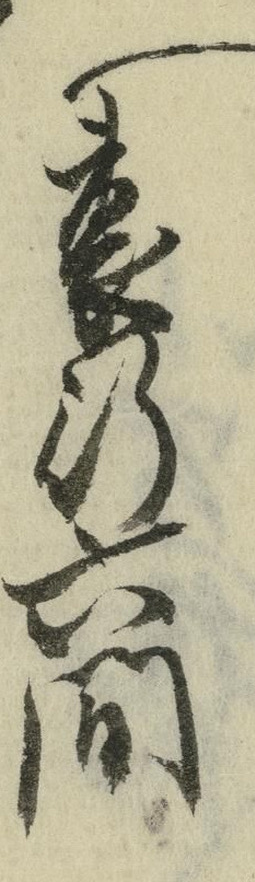裏行六間
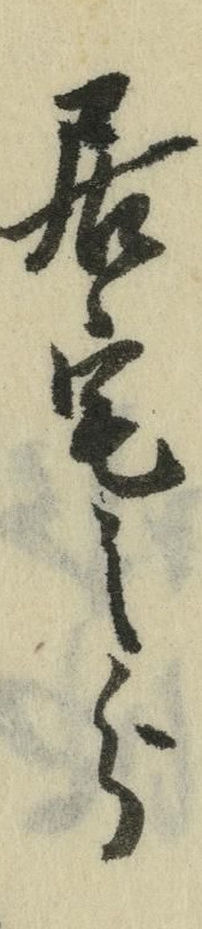居宅之分
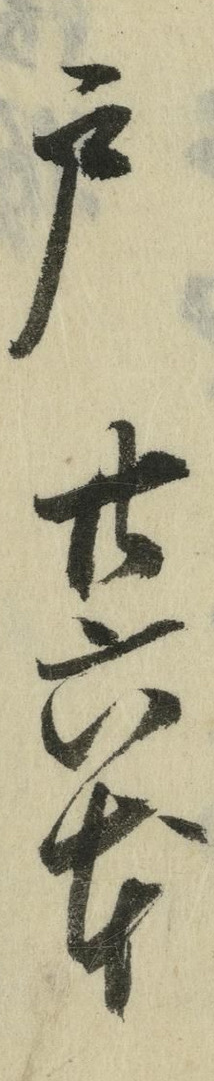戸廿六本
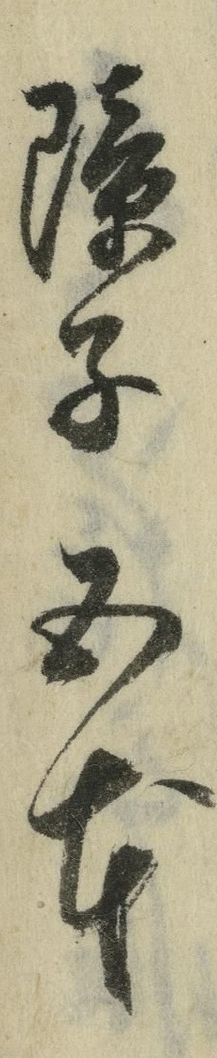障子五本

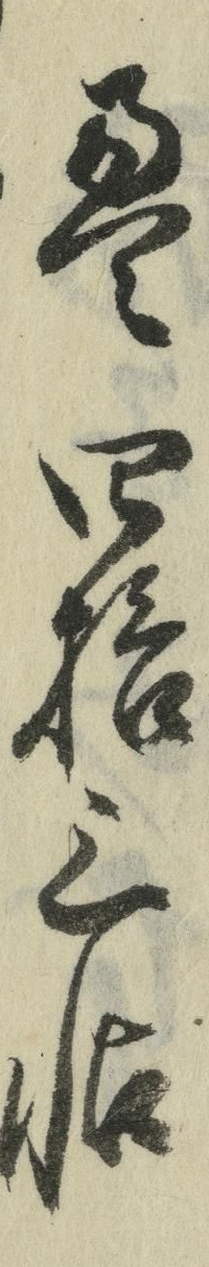畳四拾三帖
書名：天明淺間噴火ニ関スル書類
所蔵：東京大学地震研究所図書室 Earthquake Research Institute Library, The University of Tokyo, JAPAN
